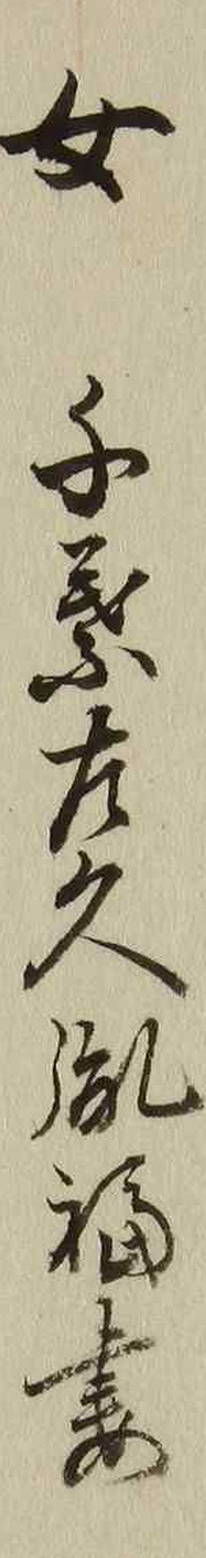女千葉左久胤福妻
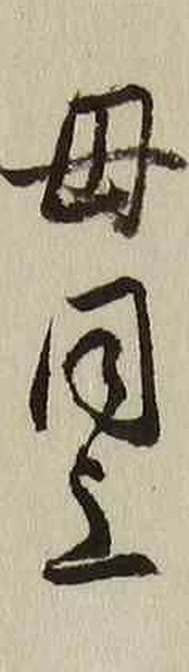母同上
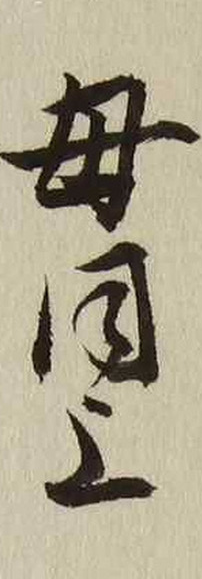母同上
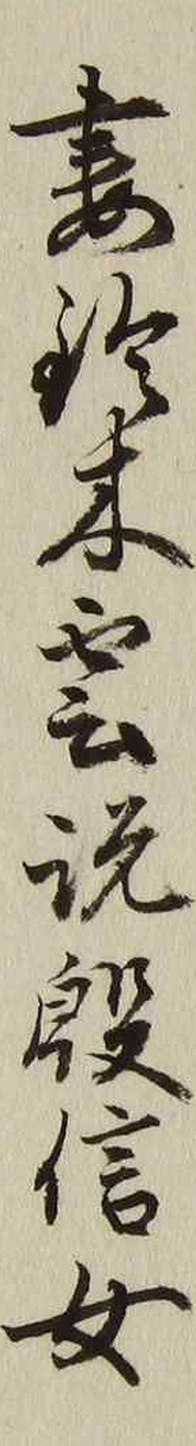妻鈴木雲説殷信女
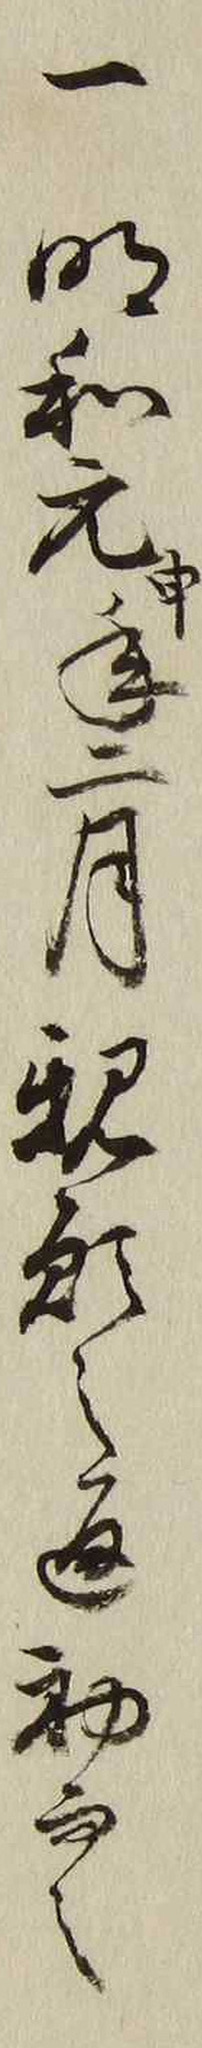一明和元申年二月親願之通初而之
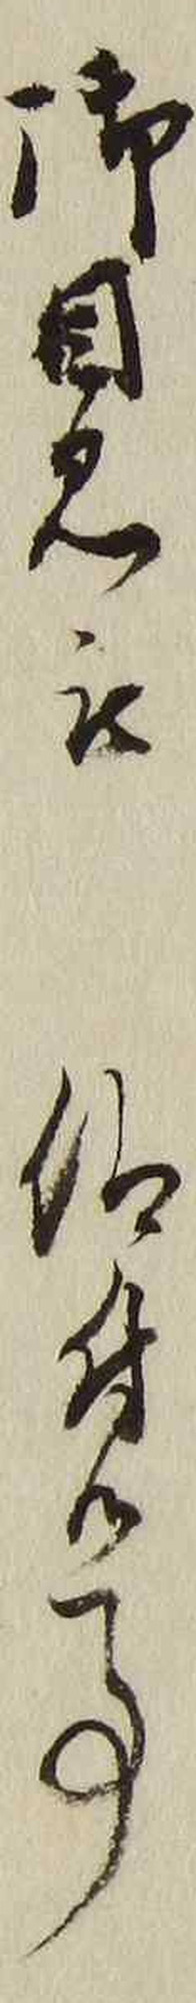御目見被仰付候事

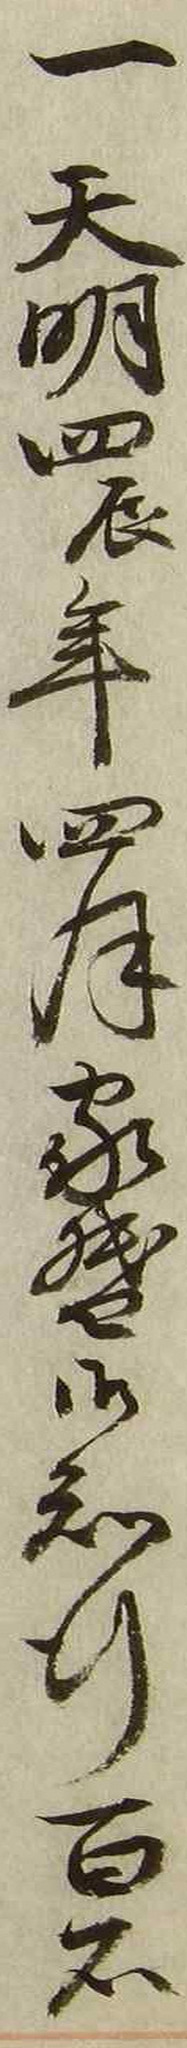一天明四辰年四月家督御知行百石
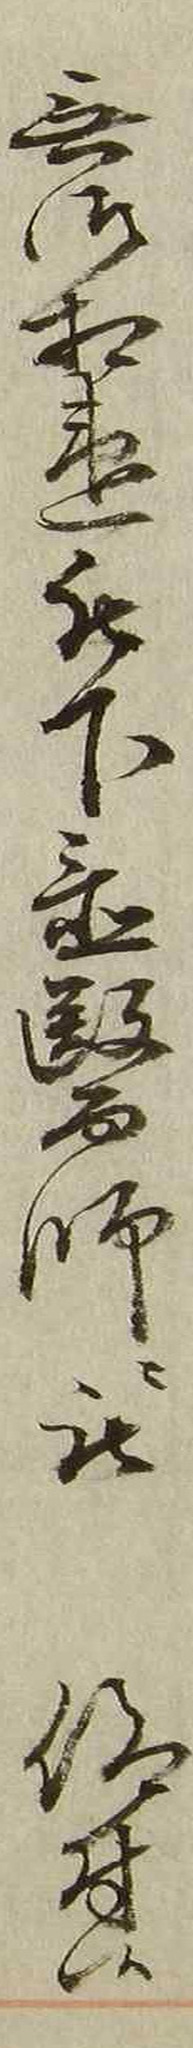無御相違被下置医師ニ被仰付候
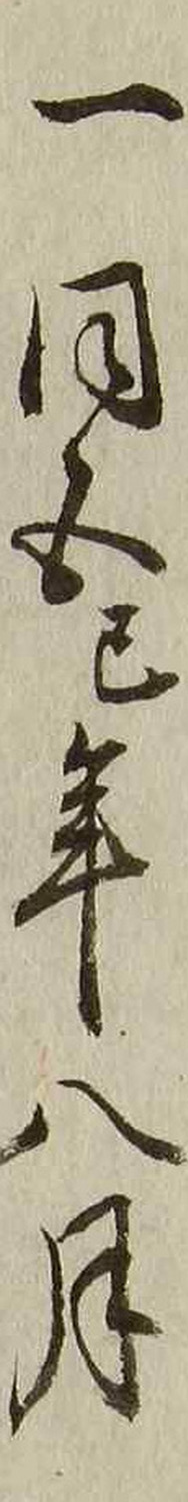一同五巳年八月
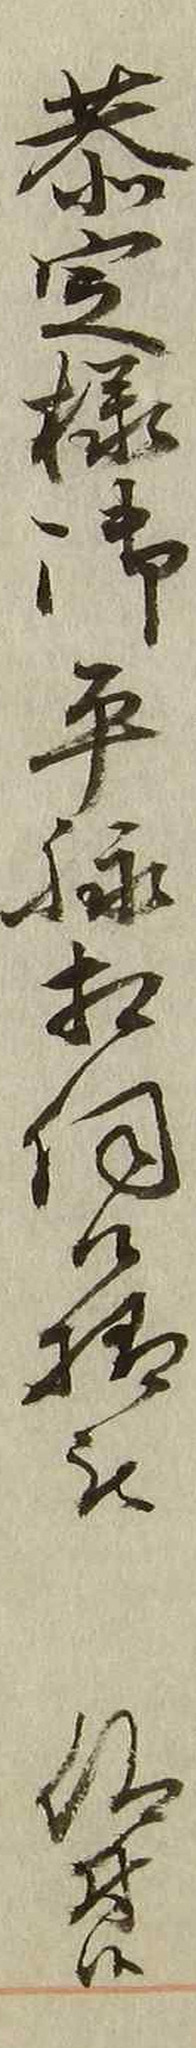恭定様御平脈相伺候様被仰付候
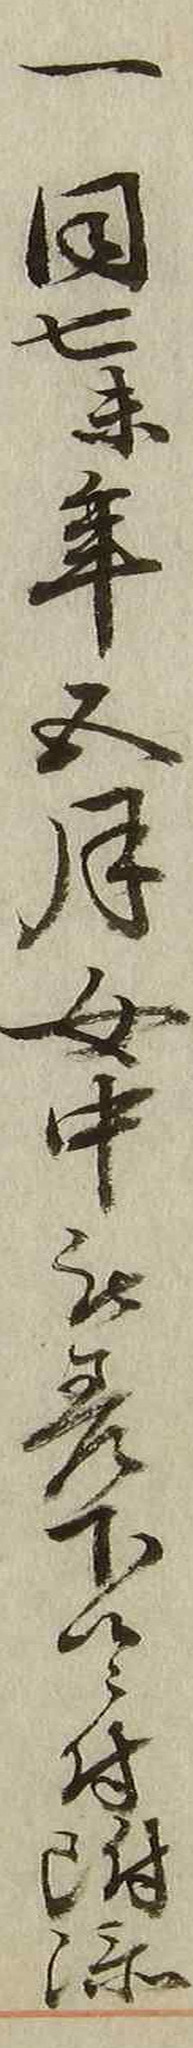一同七未年五月女中被差下候ニ付附添
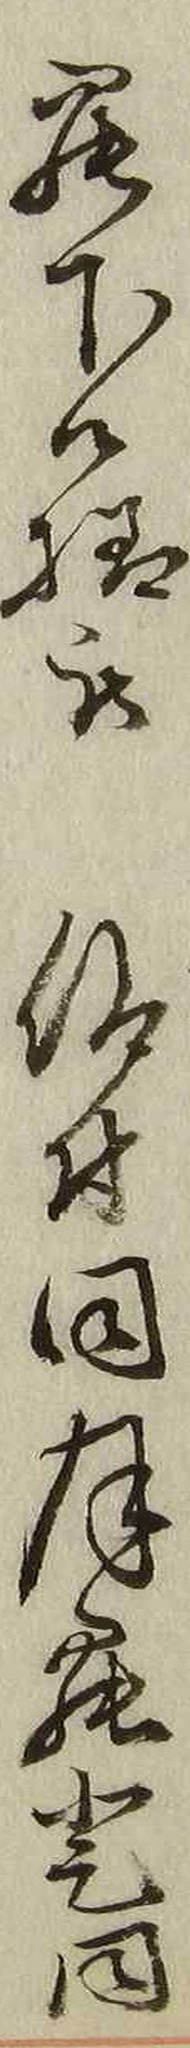罷下候様被仰付同月罷登同
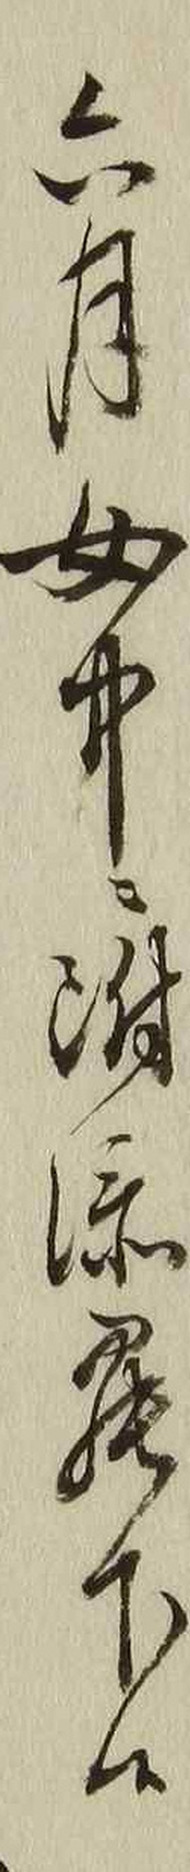六月女中ニ附添羅下候
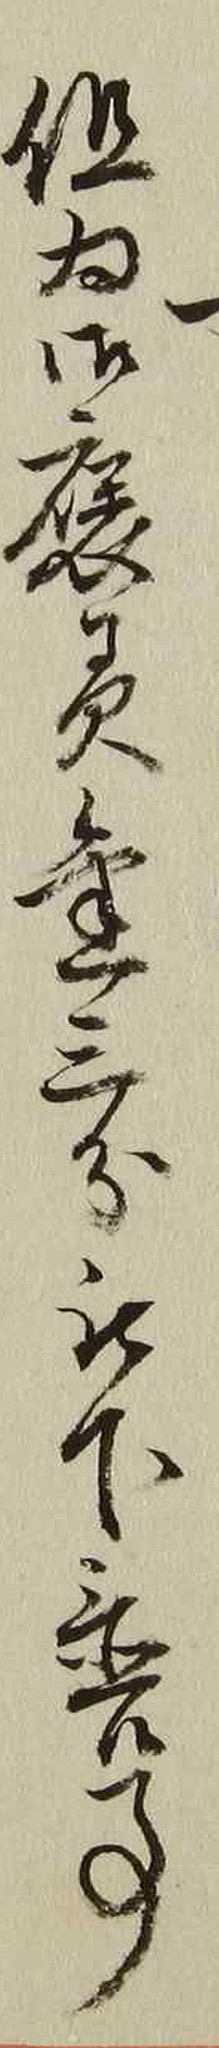但為御褒美金三分被下候事
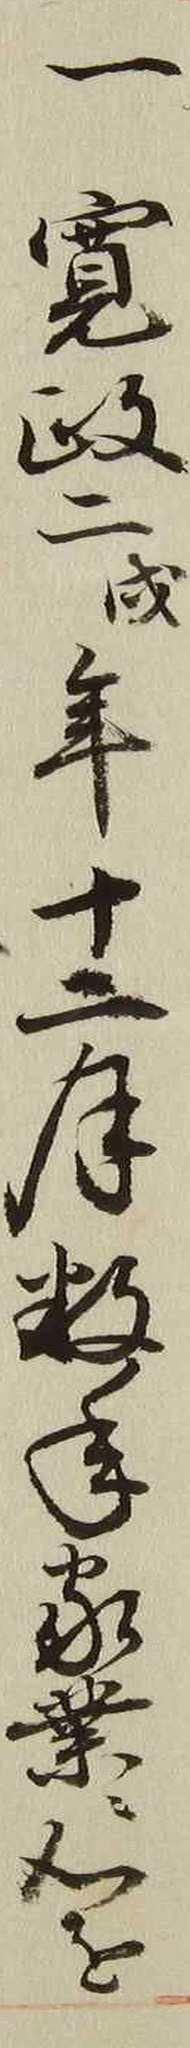一寛政二戌年十二月数年家業ニ心を
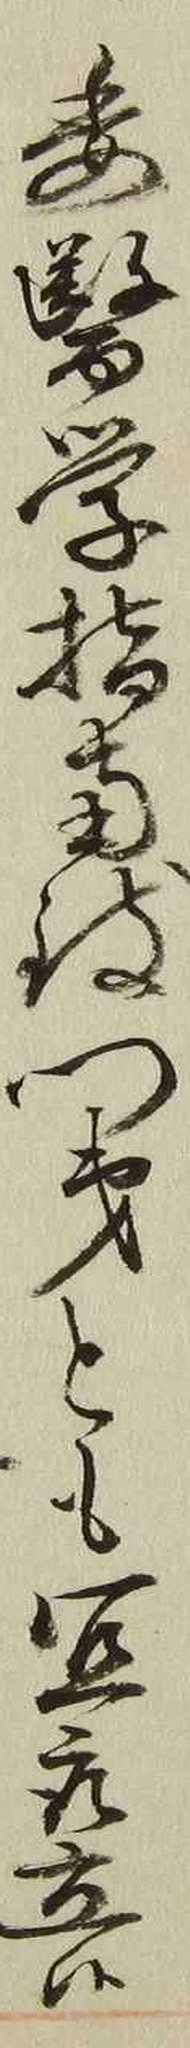委医学指南致門弟とも宜取立候
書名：諸士系譜　巻之39　は之部7
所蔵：会津若松市立会津図書館
